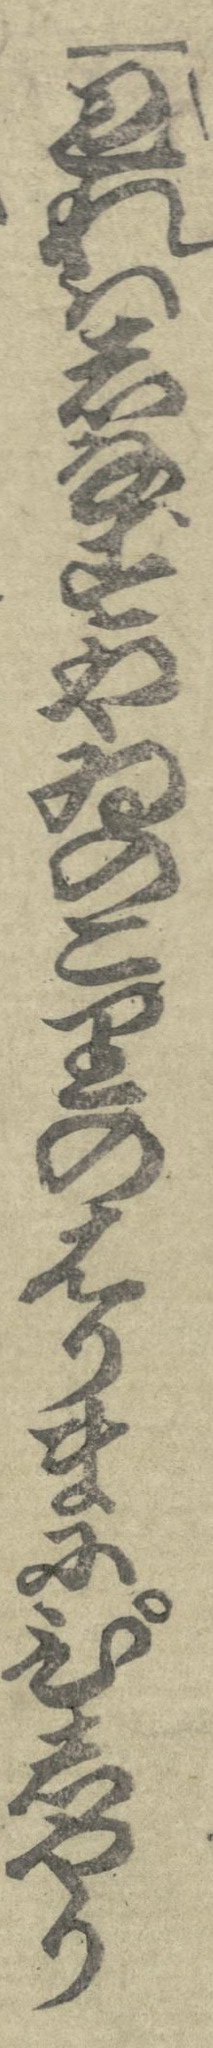〽われはしなすやゐのこりのはりまにぴしやり
